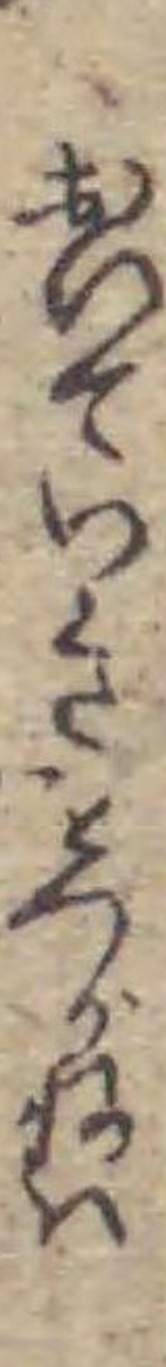おいていきをつがねは
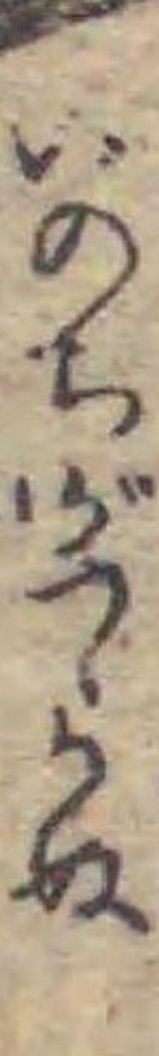いのちがつゝかぬ
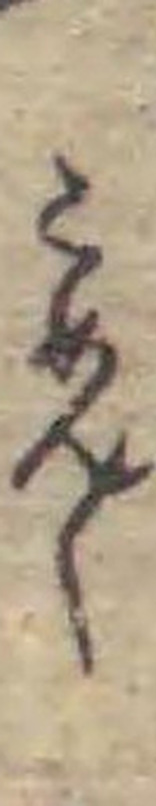こめん〳〵
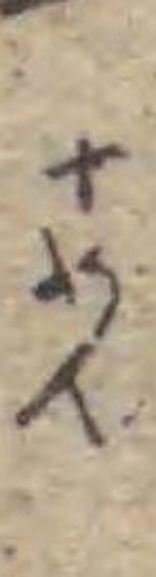十めん

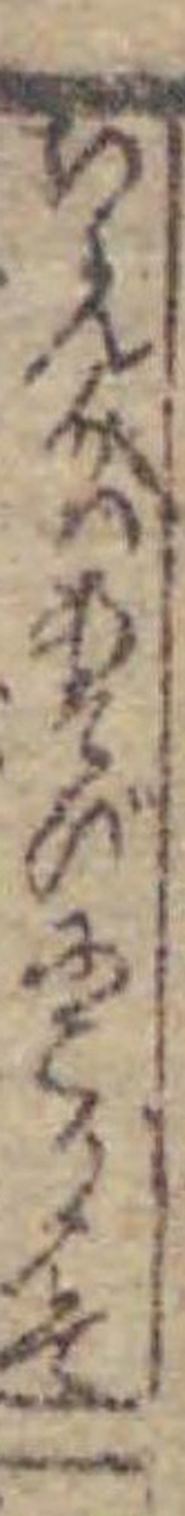ちよん介はあそびにこりはて
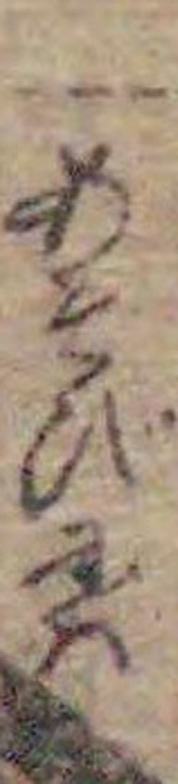あそびには
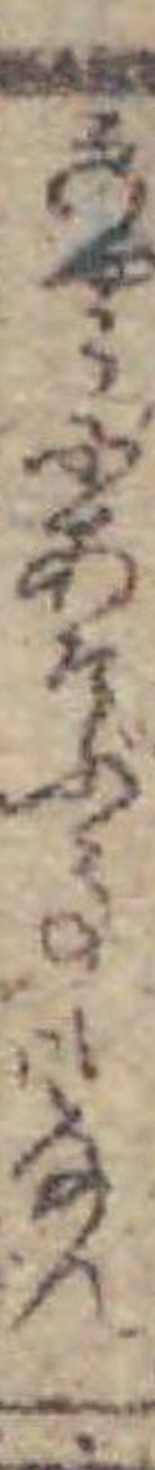このやうにあそぶ事のん
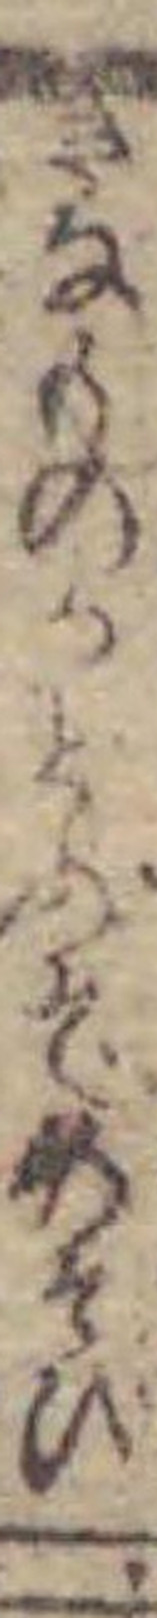きなものかとふぞあそび
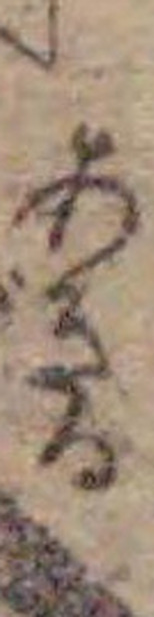あきる
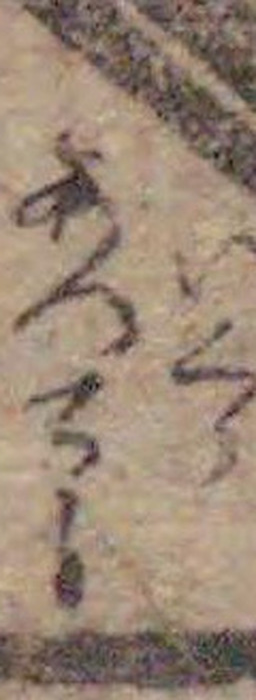あつても
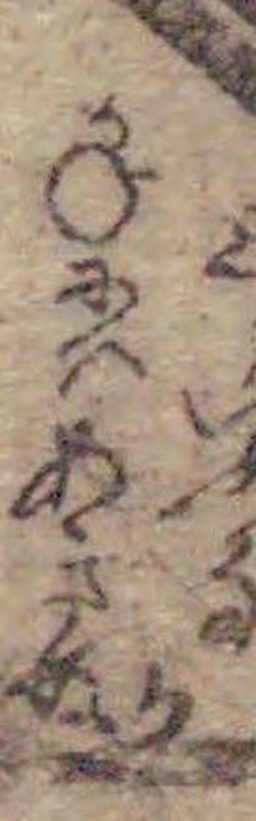かねにはあきぬ
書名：威気千代牟物語 : 2巻
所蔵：国立国会図書館 National Diet Library, JAPAN
